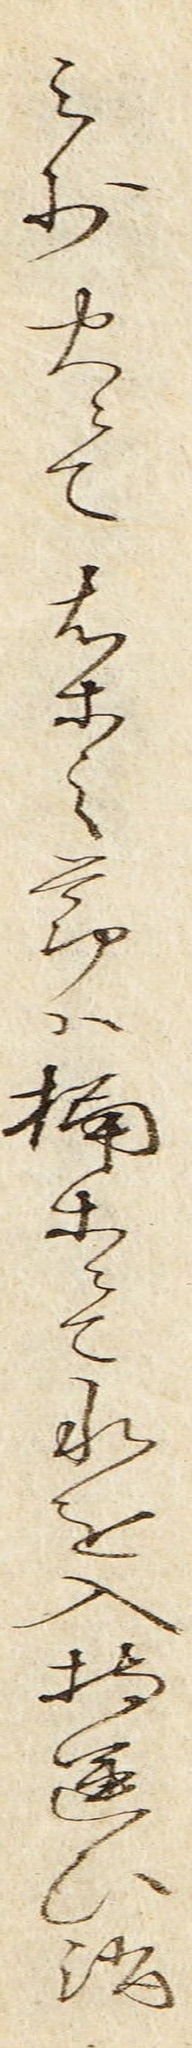之少火にて右等之節は桶等にて水を入持運ひ消

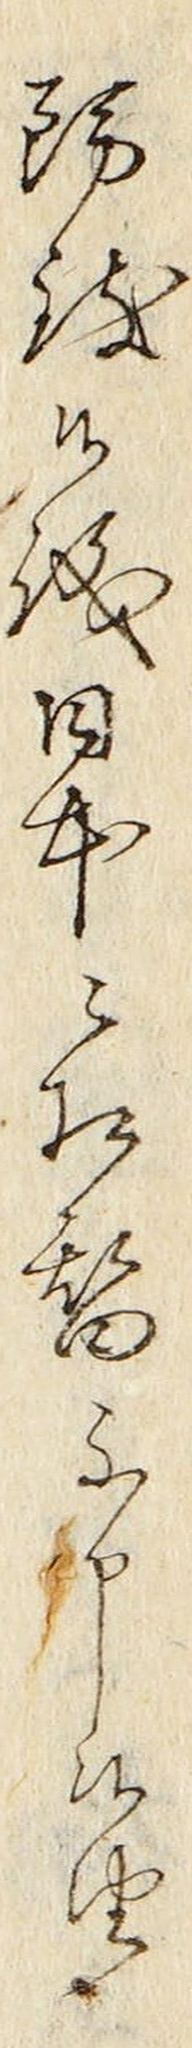防致候儀日本に相替不申候由
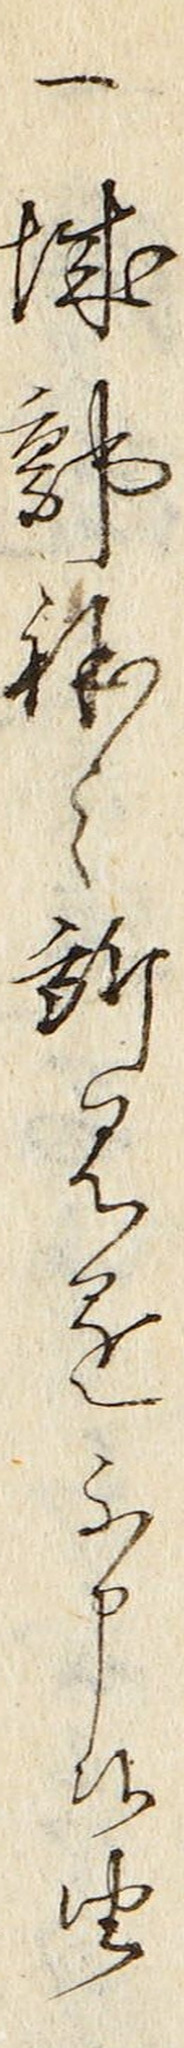一城郭躰之所見懸不申候由
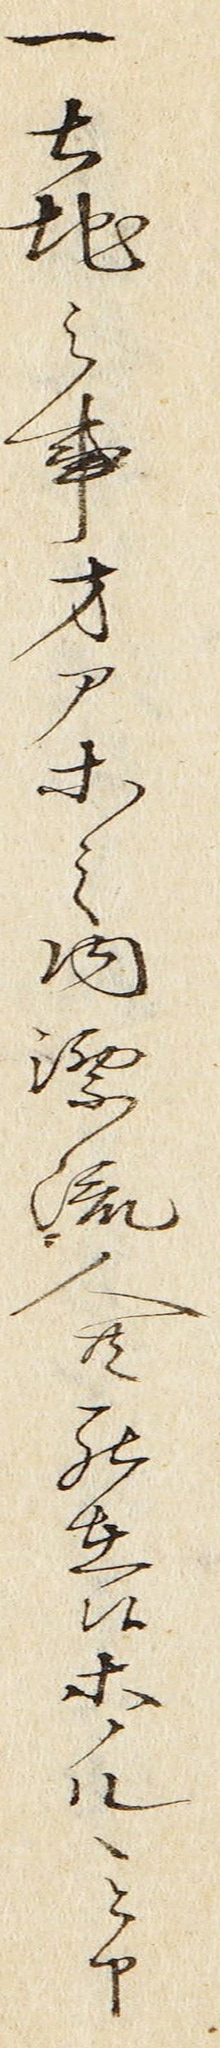一土地之事オアホ之内漂流人共罷在候ホノルヽと申
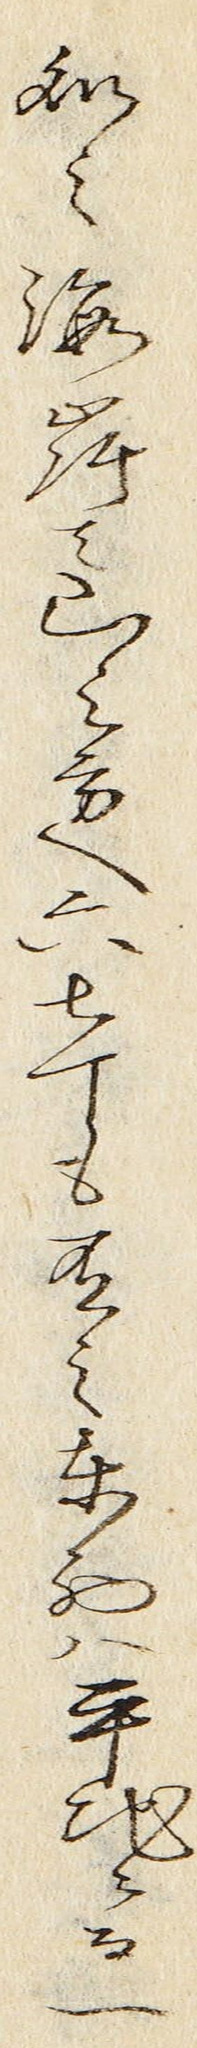処之海岸は山之方へ六七丁も有之東西は平地に而一
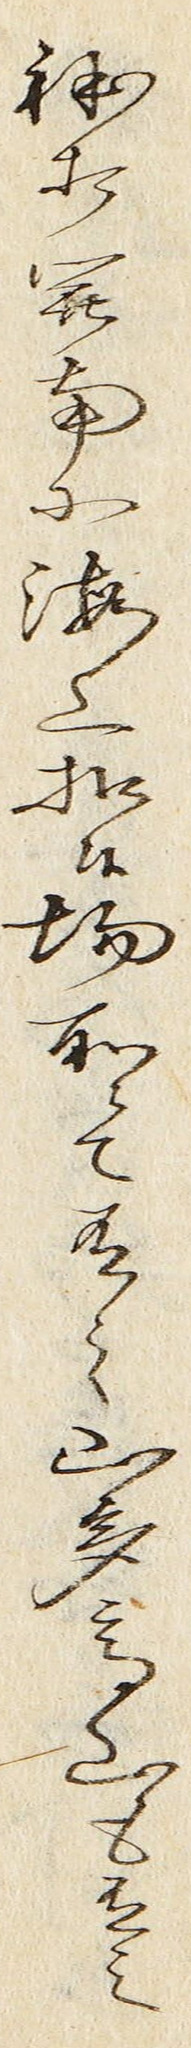躰相開南に海上扣候場所にて有之山多高山も有之
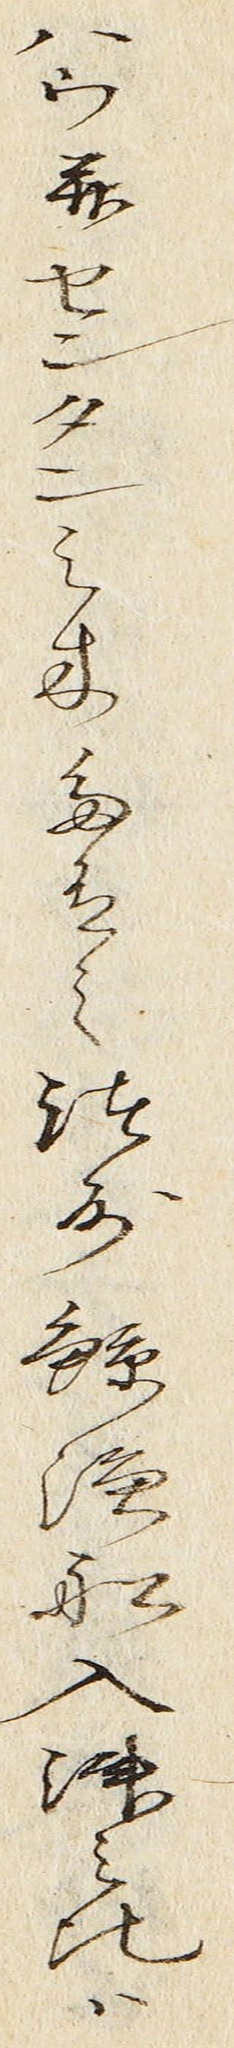ハウ并センタン之木多有之諸州鯨漁船入津之比は
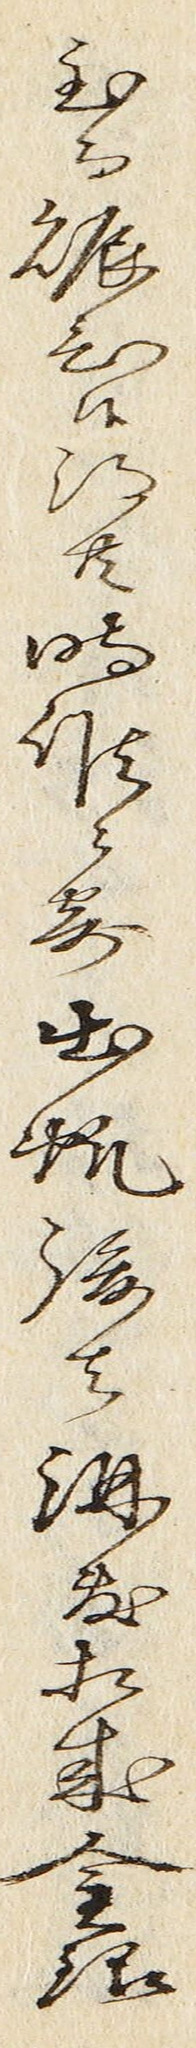至而賑ひ候得共時候に寄出帆後は淋敷相成金銀
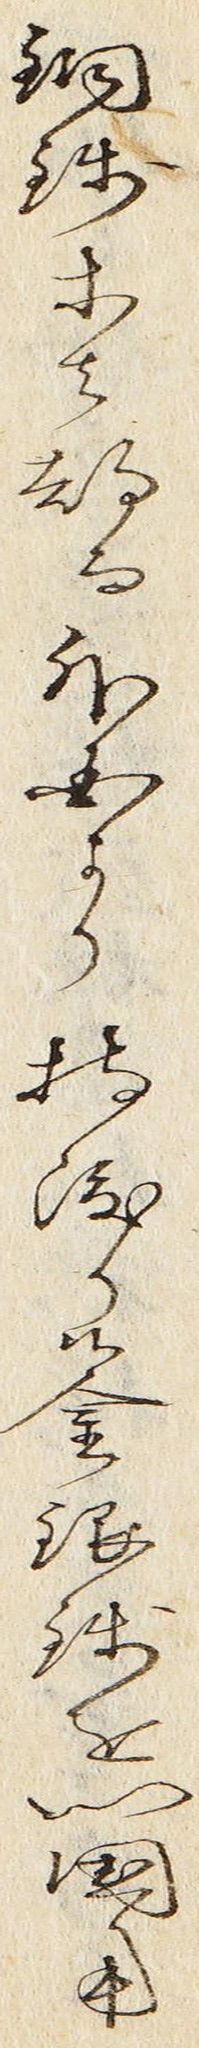銅銭等は都而外国より持渡り候金銀銭を以国用
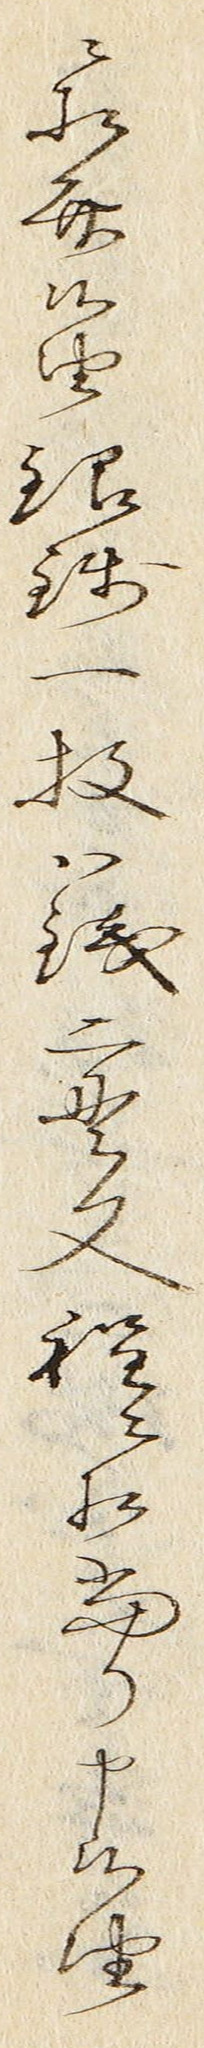に相弁候由銀銭一枚は銭二貫文に相当り申候由
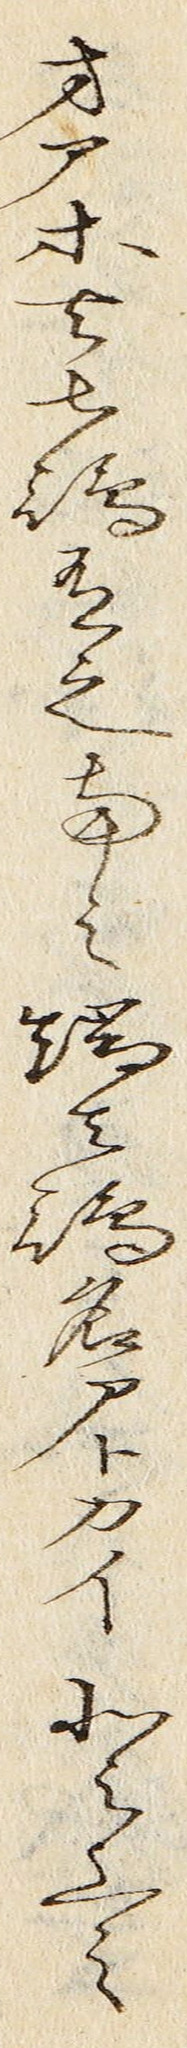オアホは七嶋有之南之端は嶋名アトカイ北之上之
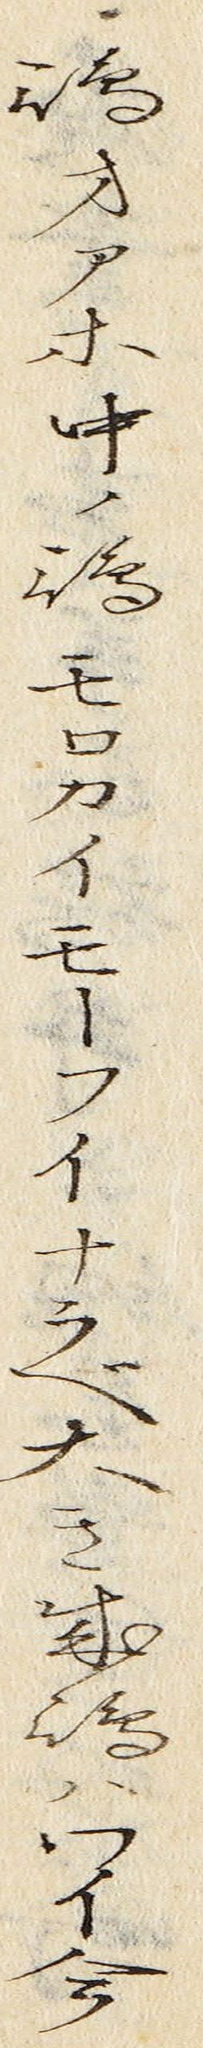嶋オアホ中ノ嶋モロカイモーフイナラベ大き成嶋ハワイ今
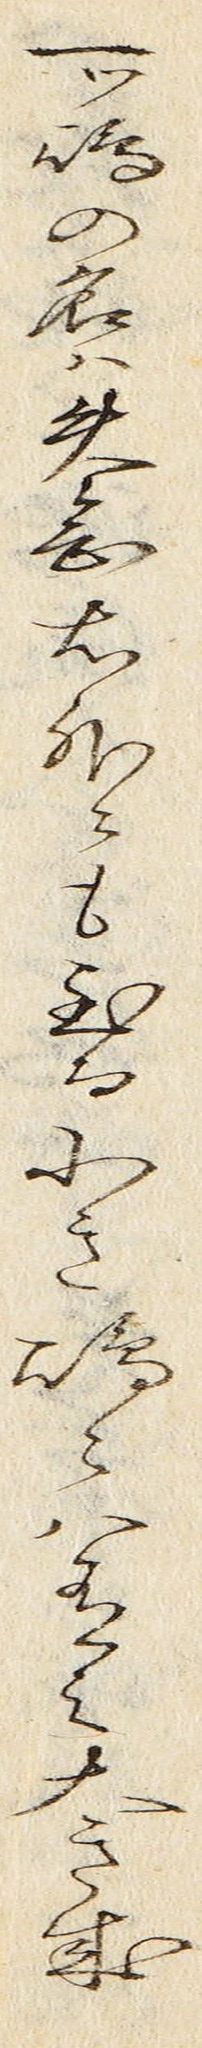一ッ嶋の名は失念右外にも至而小き嶋々は有之大き成
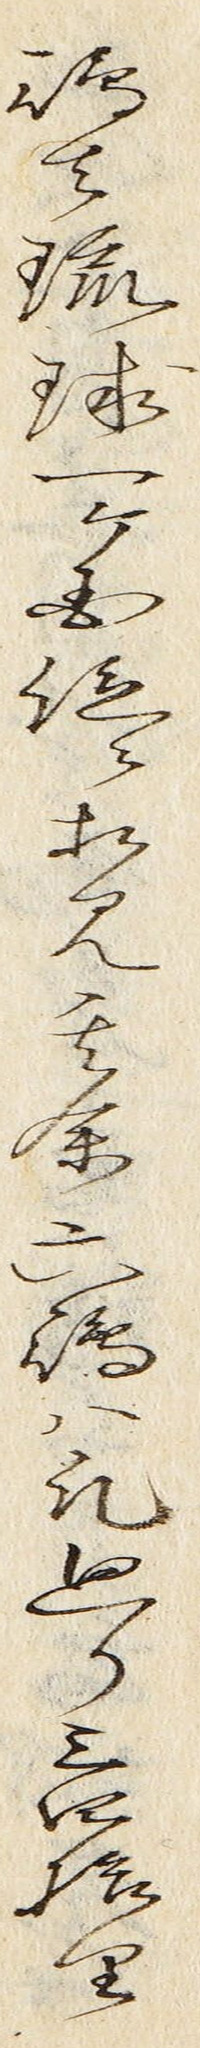嶋は琉球一ヶ国位に相見其余六嶋は凡廻り三四拾里
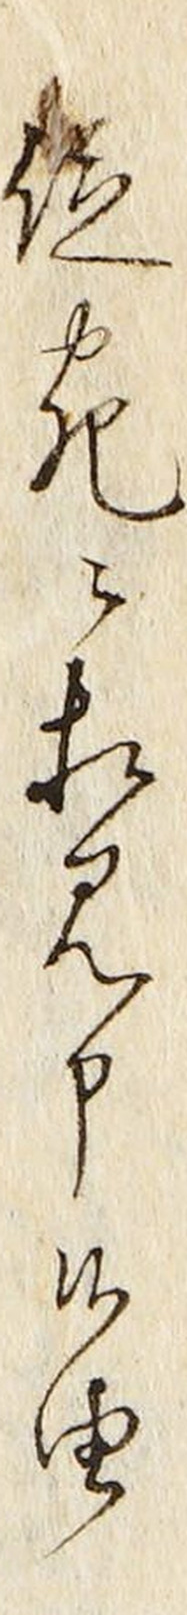位宛に相見申候由
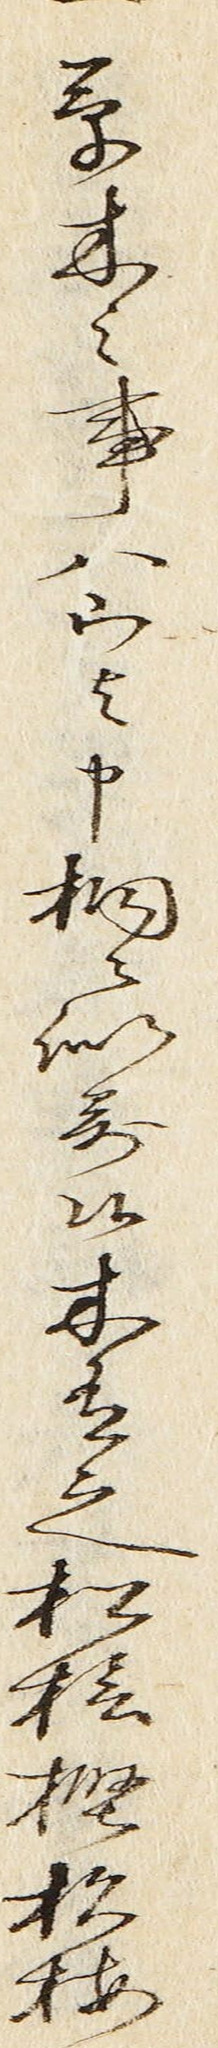一草木之事ハウ与申桐に似寄候木有之松桧樫杦梅
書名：土佐中浜万次郎漂流記
